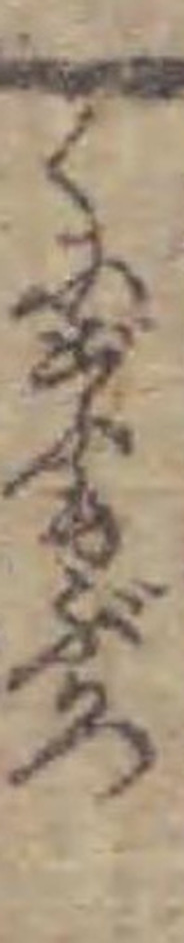くにどふもぶかつ
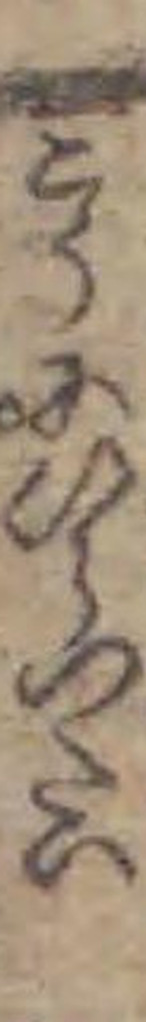こうにひらつたい
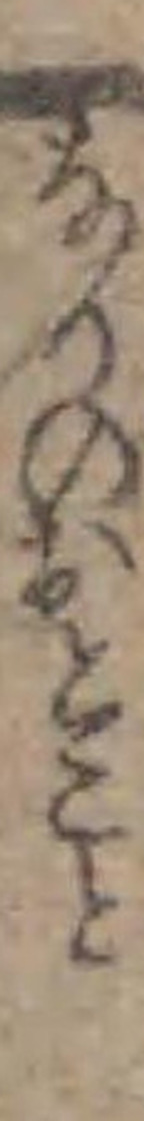なりのおとこと
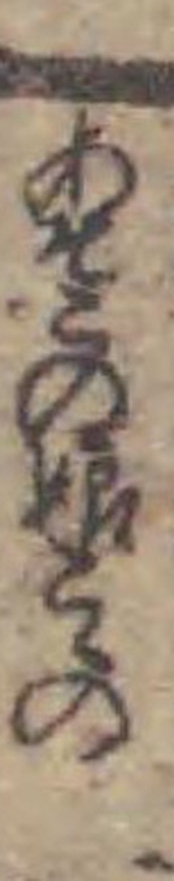あそこの娘ここの
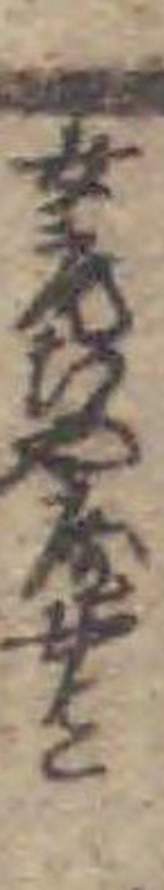女房ちゃ屋女と
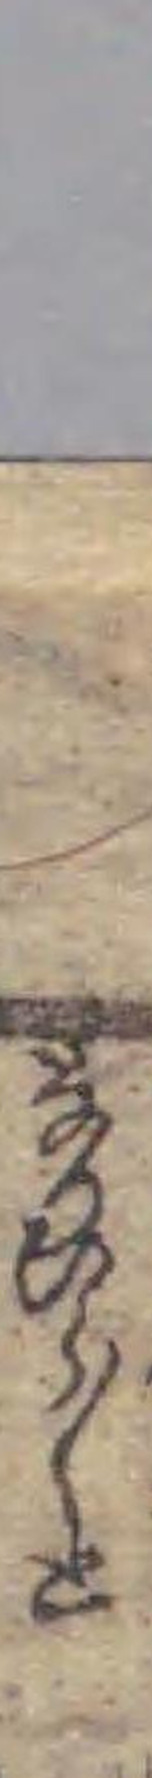なりひら〳〵と
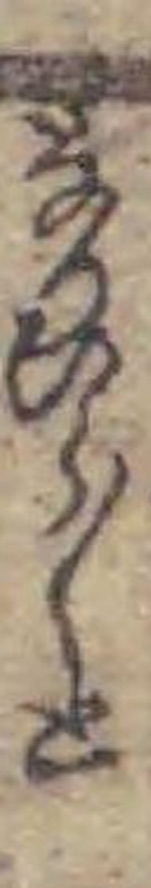なりひら〳〵と
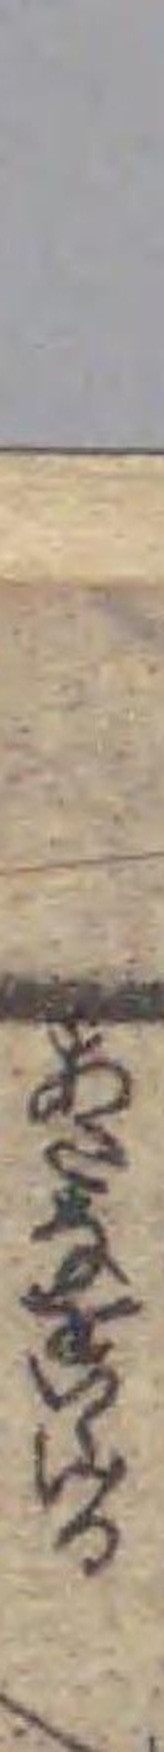あたなをいゝける
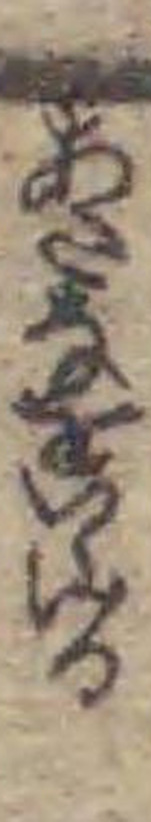あたなをいゝける
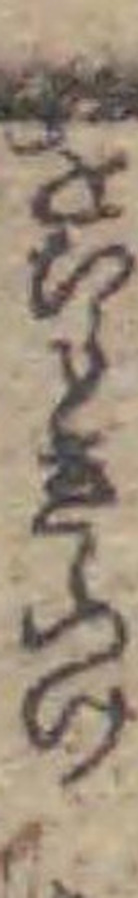をちときゝつけ
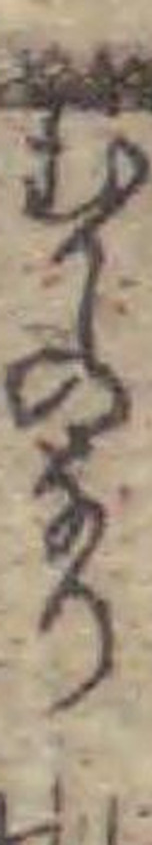むかしのなり
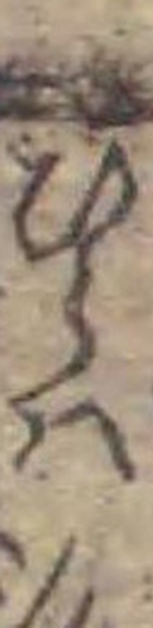ひらは
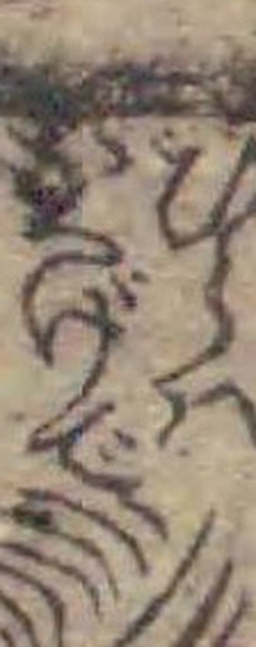おくげで
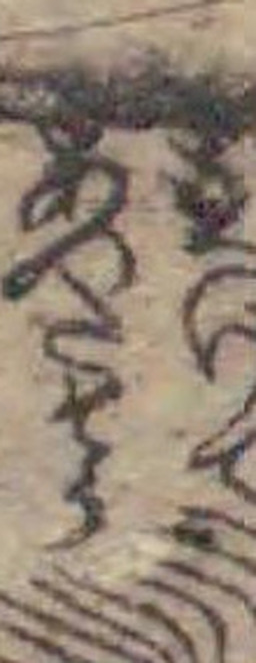あつたそう
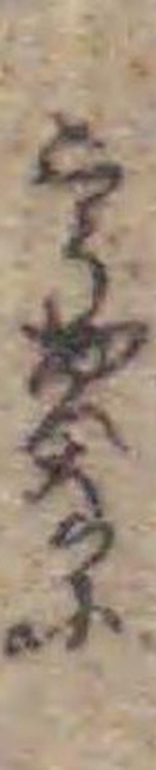こうおんなに
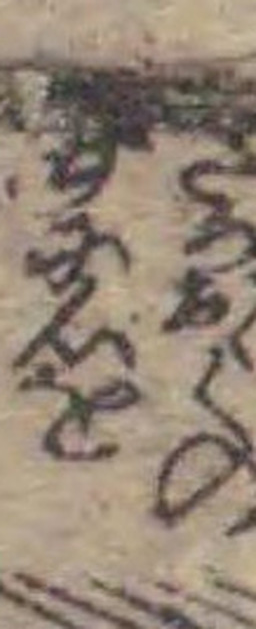女に心を
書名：通風伊勢物語 : 3巻
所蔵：国立国会図書館 National Diet Library, JAPAN
